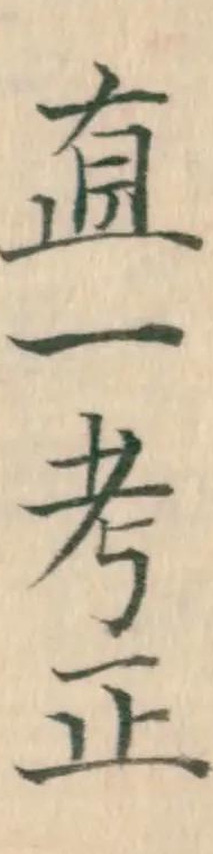直一考正
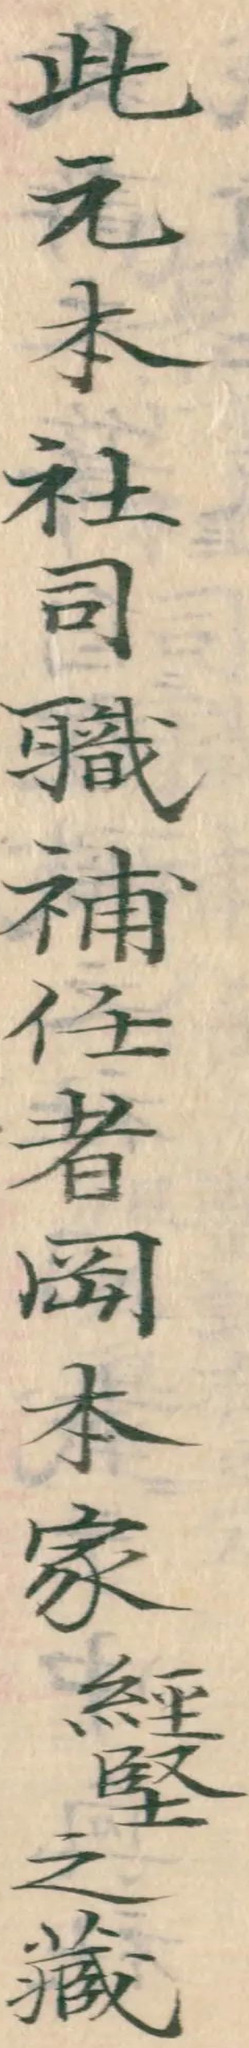此元本社司職補任者岡本家経竪之蔵
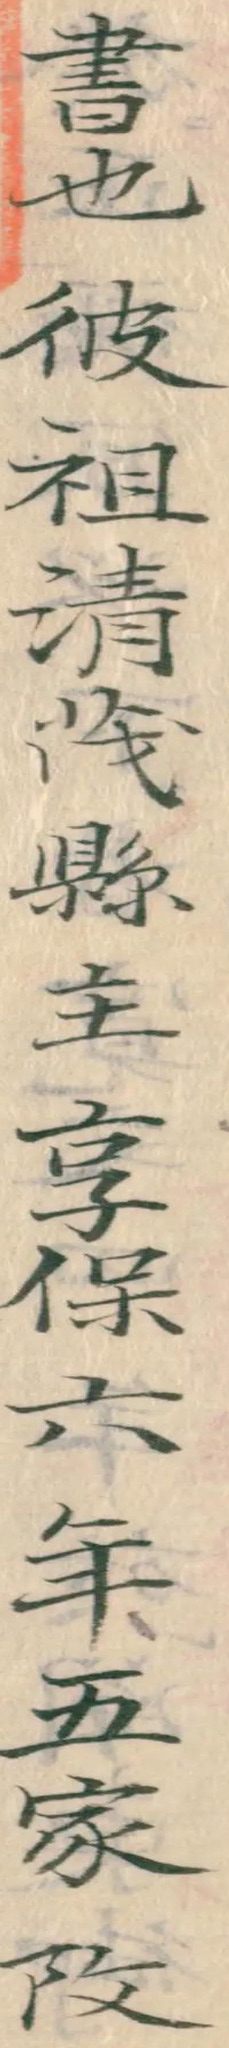書也彼祖清茂県主享保六年五家改
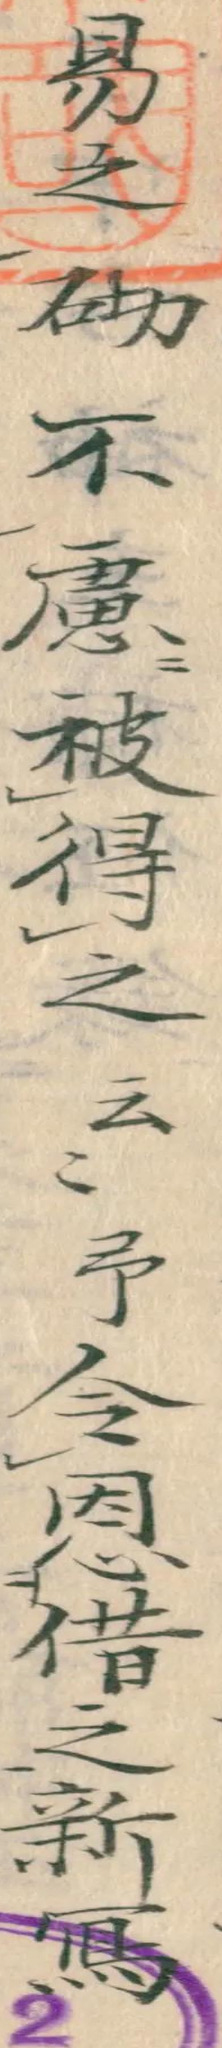易之砌不慮被得之云々予令恩借之新写
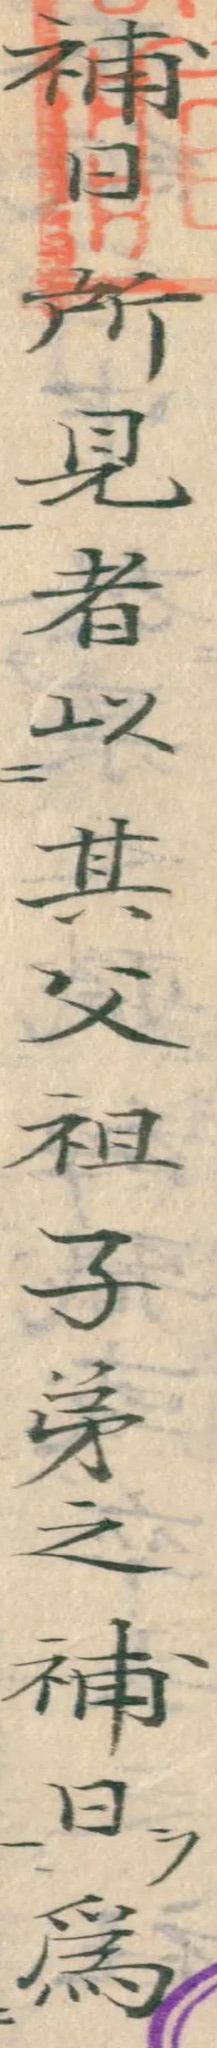補日所見者以其父祖子弟之補日為

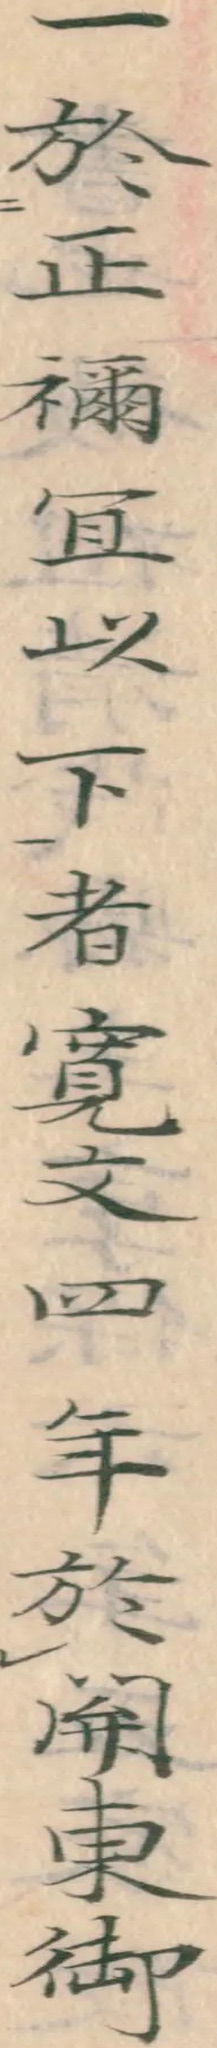一於正祢宜以下者寛文四年於関東御
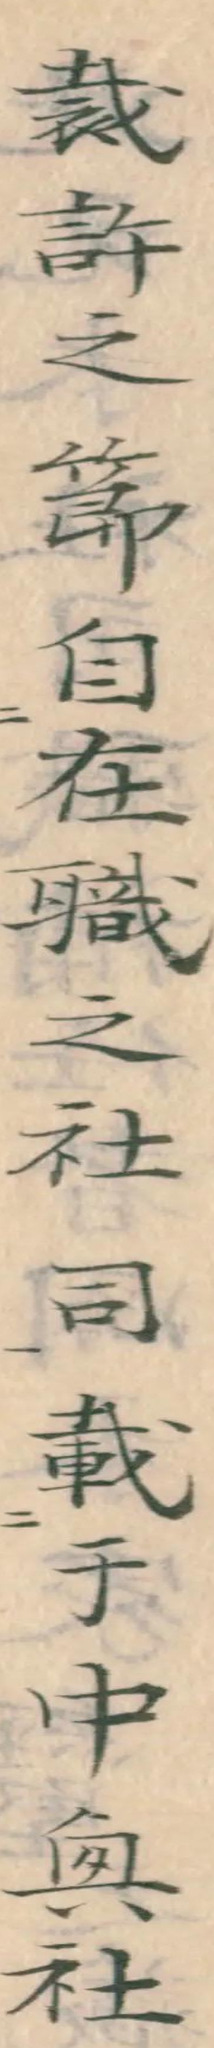裁許之節自在職之社司載于中奥社
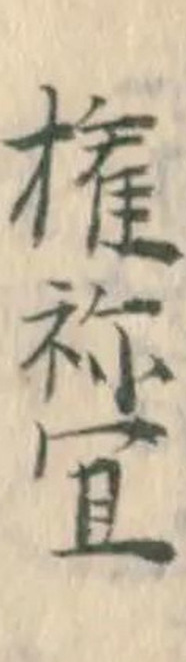権祢宜
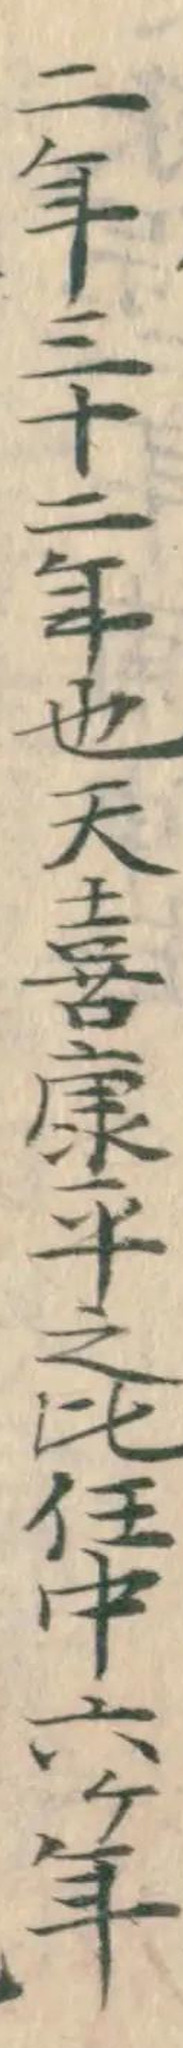月日二年三十二年也天喜康平之比任中六ヶ年
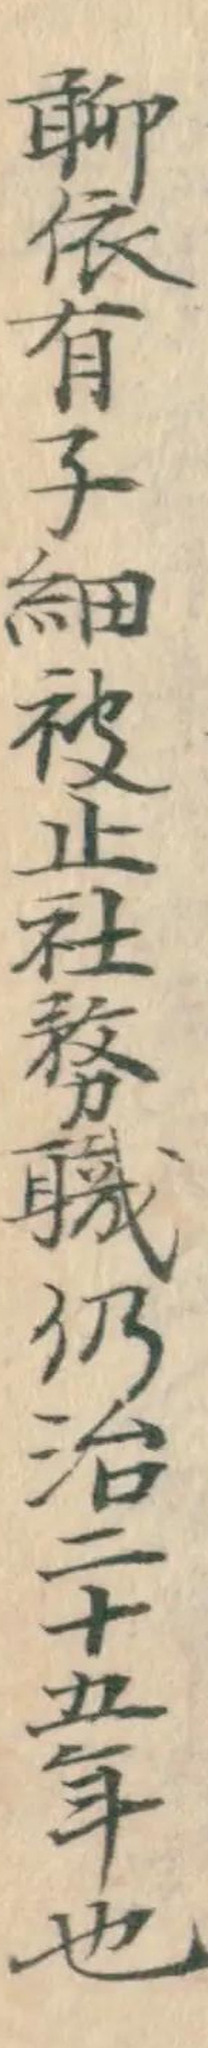聊依有子細被止社務職仍治二十五年也

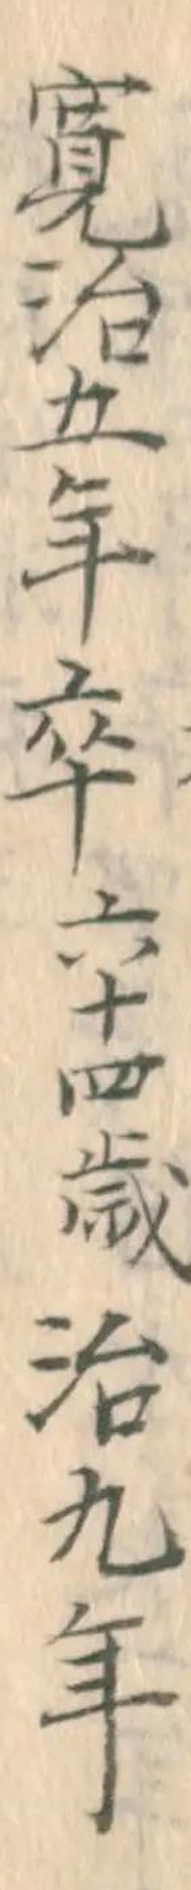寛治五年卒六十四歳治九年
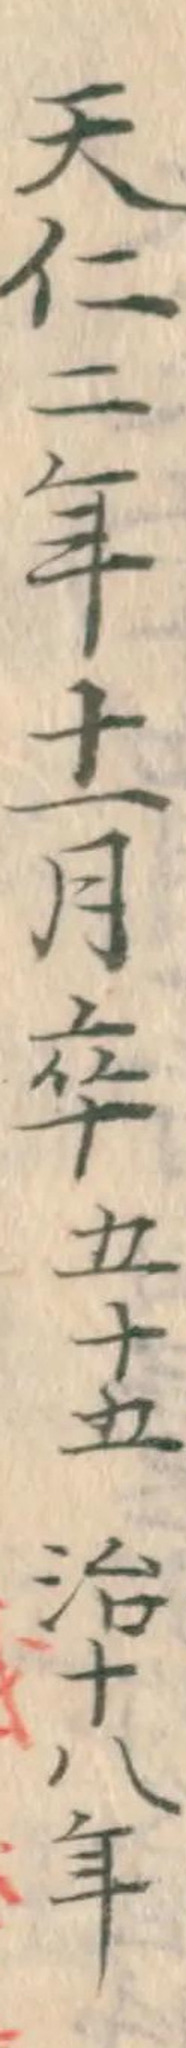天仁二年十一月卒五十五治十八年
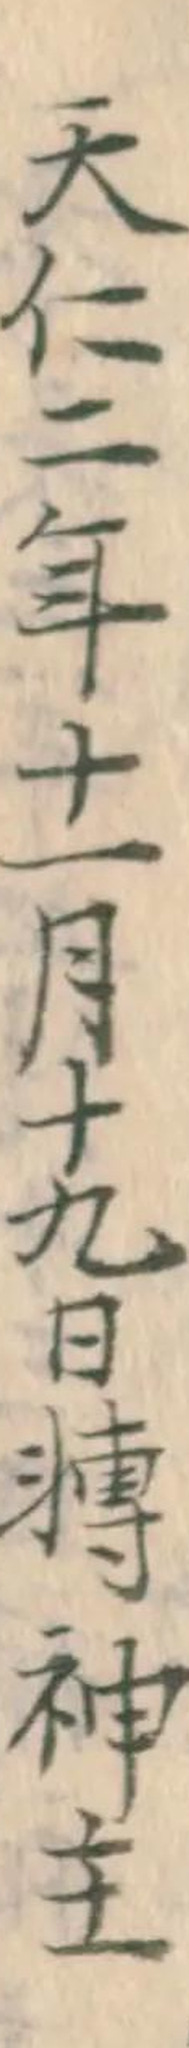天仁二年十一月十九日転神主
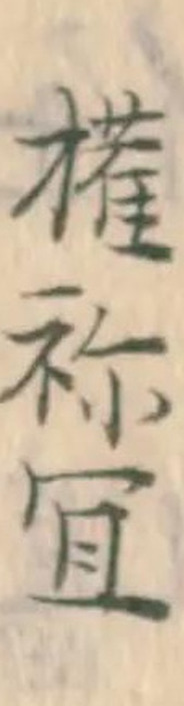権祢宜
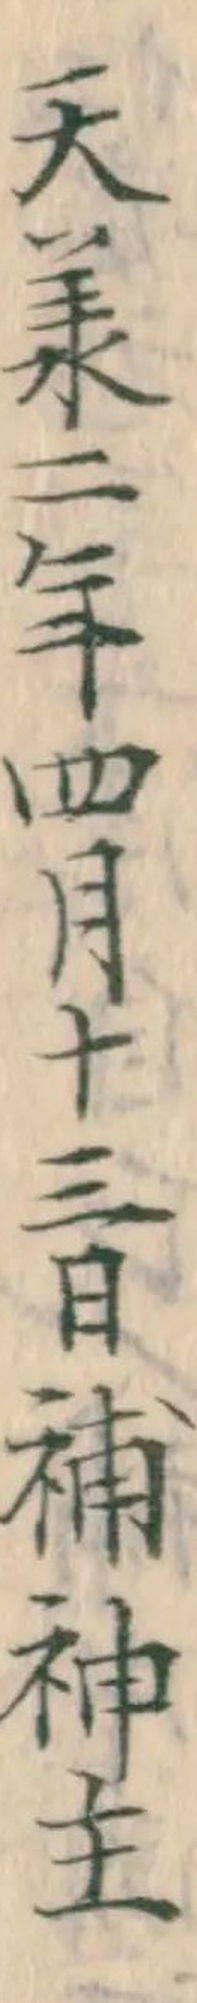天仁二年十一月十九日転神主
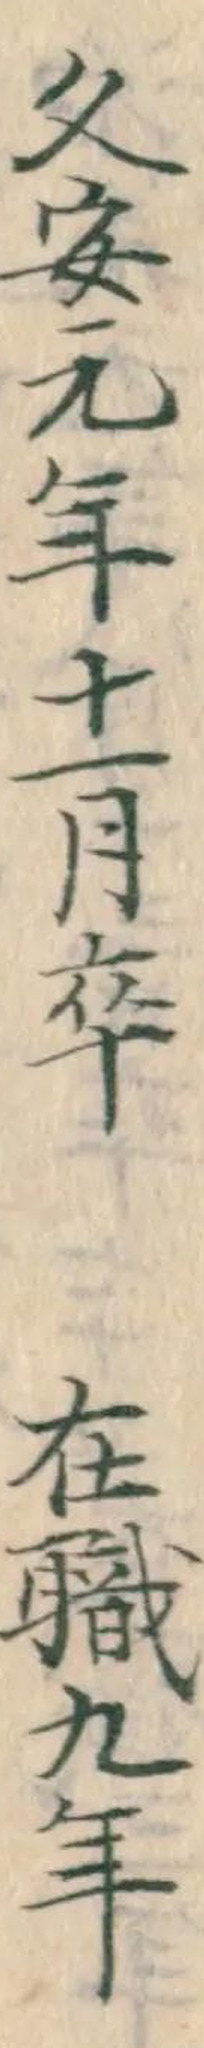久安元年十月卒在職九年
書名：賀茂社記録. 第23冊
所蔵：国立国会図書館 National Diet Library, JAPAN
